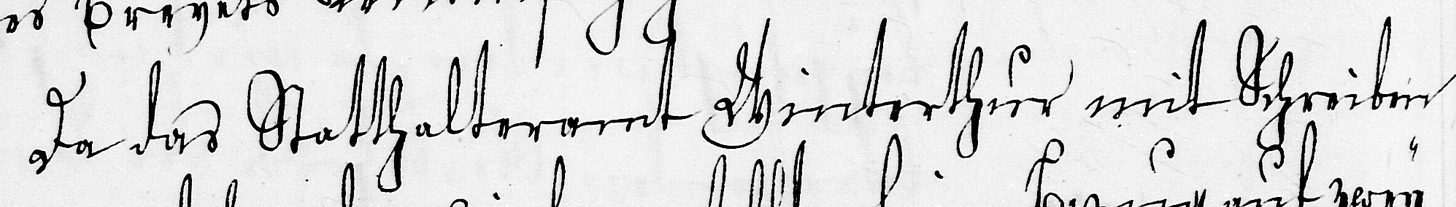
Da das Statthalteramt Winterthur mit Schreiben
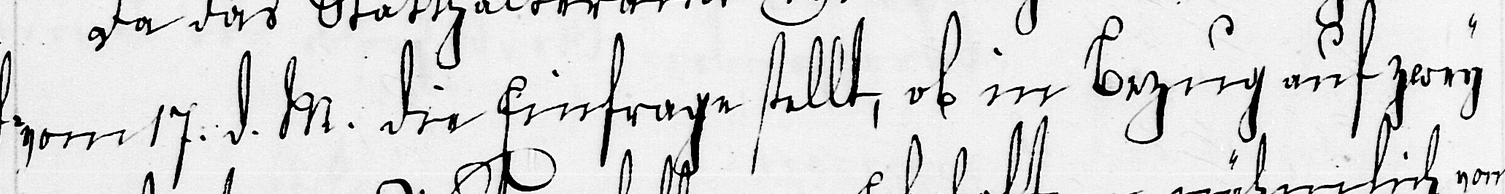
vom 17. d. M. die Einfrage stellt, ob in Bezug auf zwey
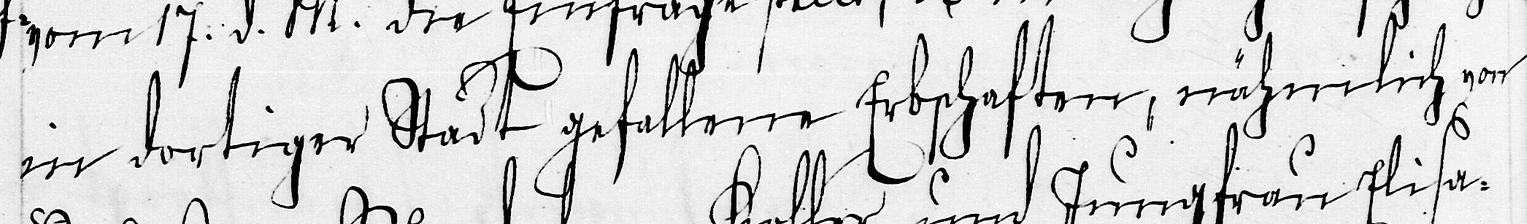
in dortiger Stadt gefallene Erbschaften, nähmlich
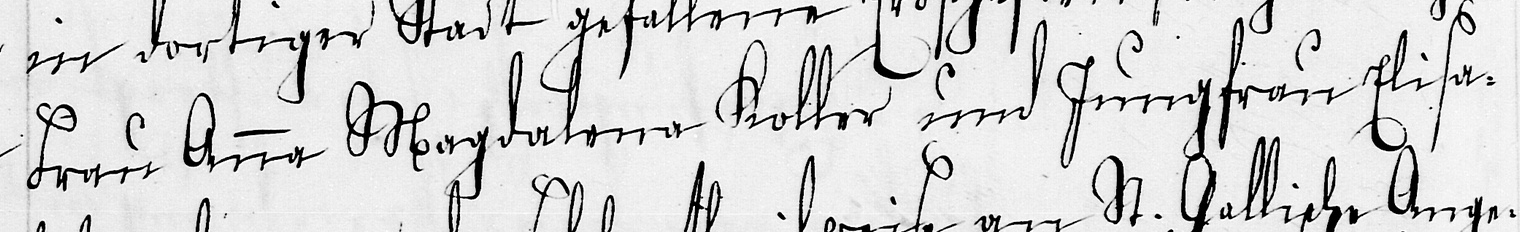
Frau Anna Magdalena Koller und Jungfrau Elisa¬
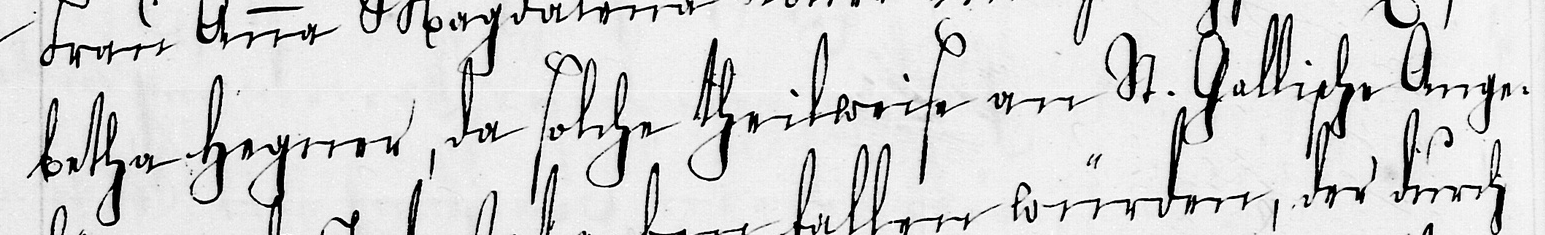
betha Hegner, da solche theilweise an St. Gallische Ang¬
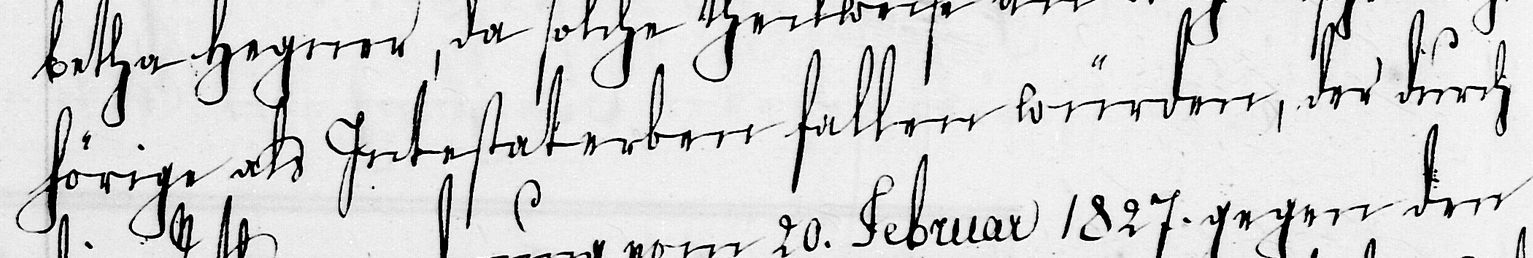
ehörige als Intestaterben fallen würden, der durch
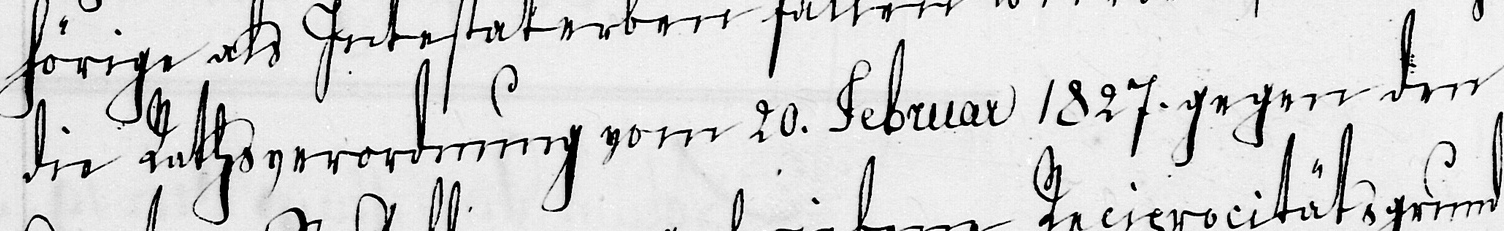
die Rathsverordnung vom 20. Februar 1827. gegen den
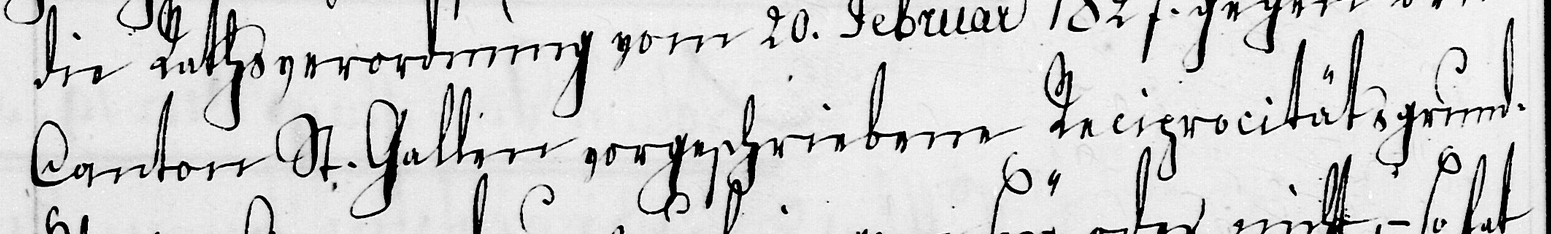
Canton St. Gallen vorgeschriebene Reciprocitätsgrund¬
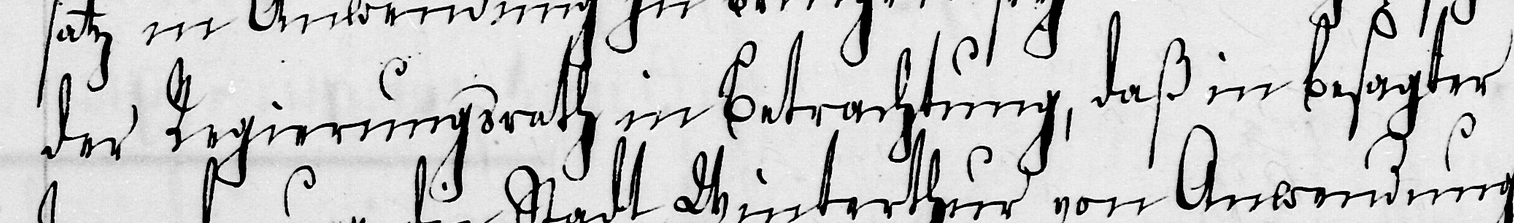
der Regierungsrath in Betrachtung, daß in besagter
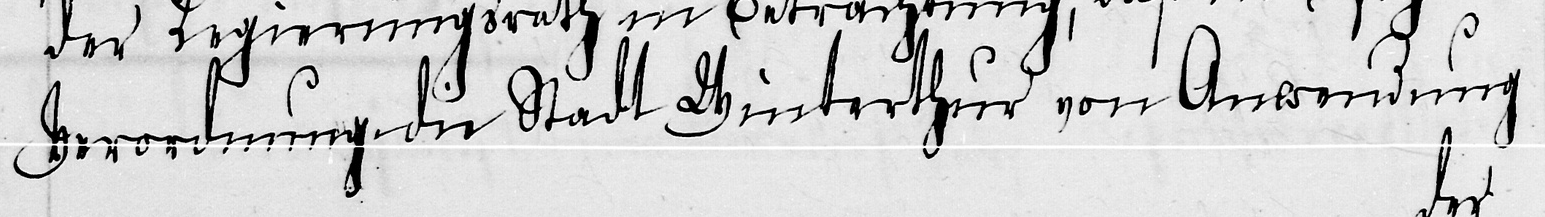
Verordnung die Stadt Winterthur von Anwendung
